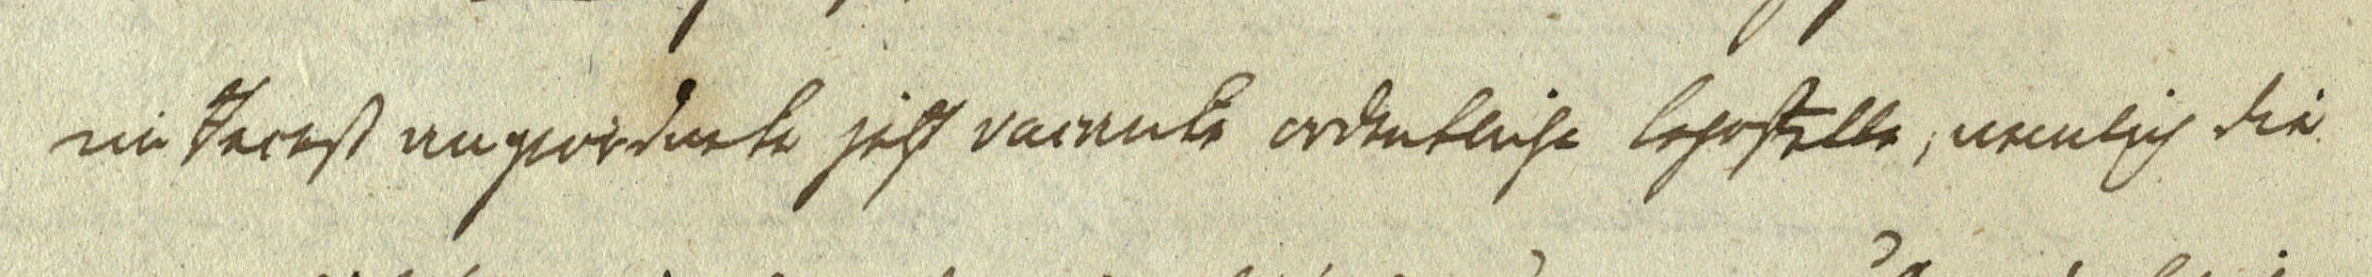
im Receß angeordnete jetzt vacante ordentliche Lehrstelle, nemlich die
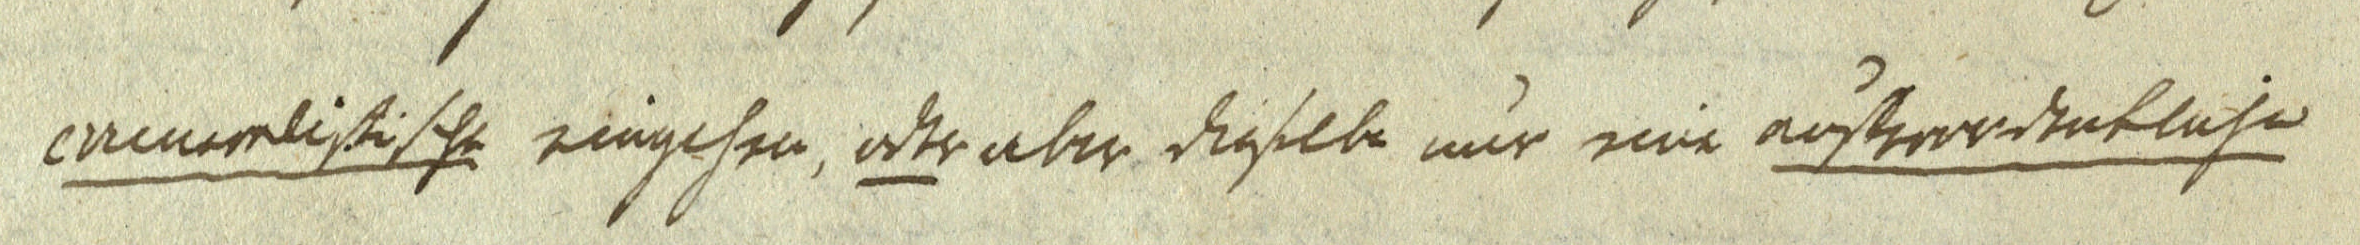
cameralistische eingehen, oder aber dieselbe nur eine ausserordentliche
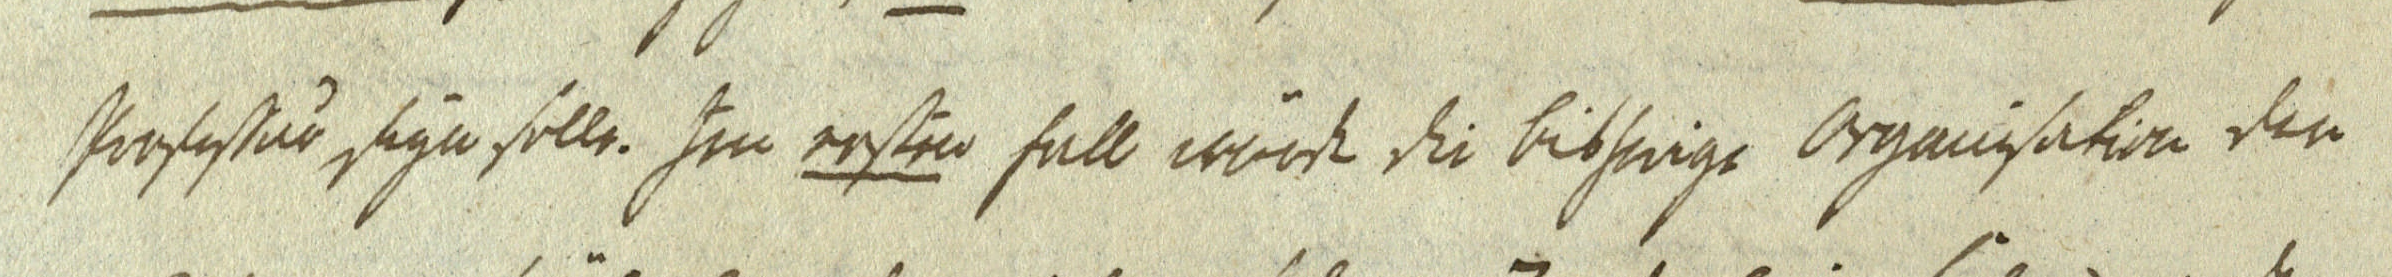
Professur seÿn solle. Im ersten Fall würde die bisherige Organisation der
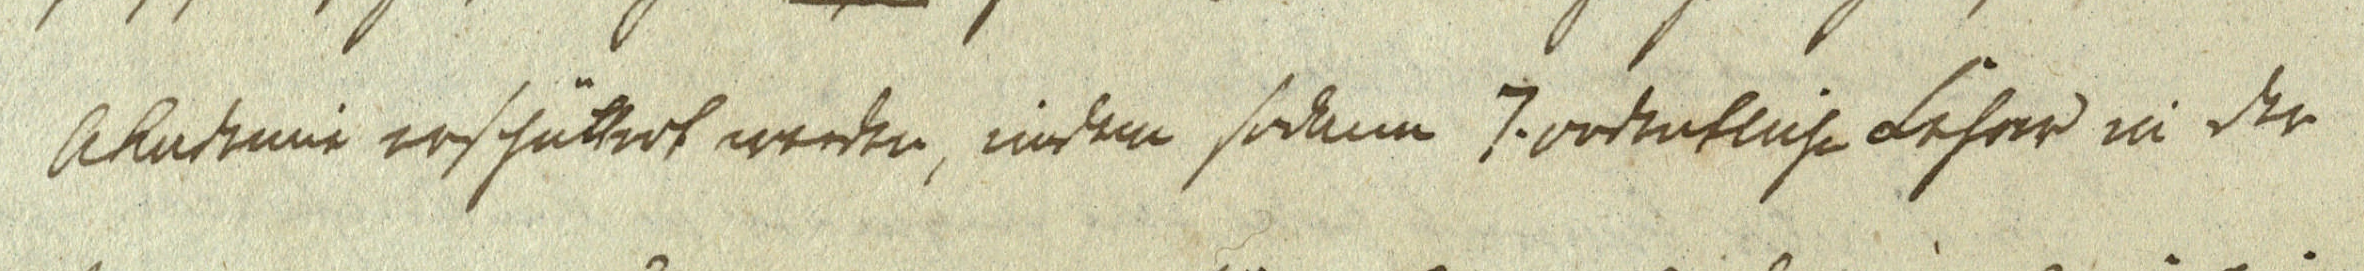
Akademie erschüttert werden, indem sodann 7. ordentliche Lehrer in der
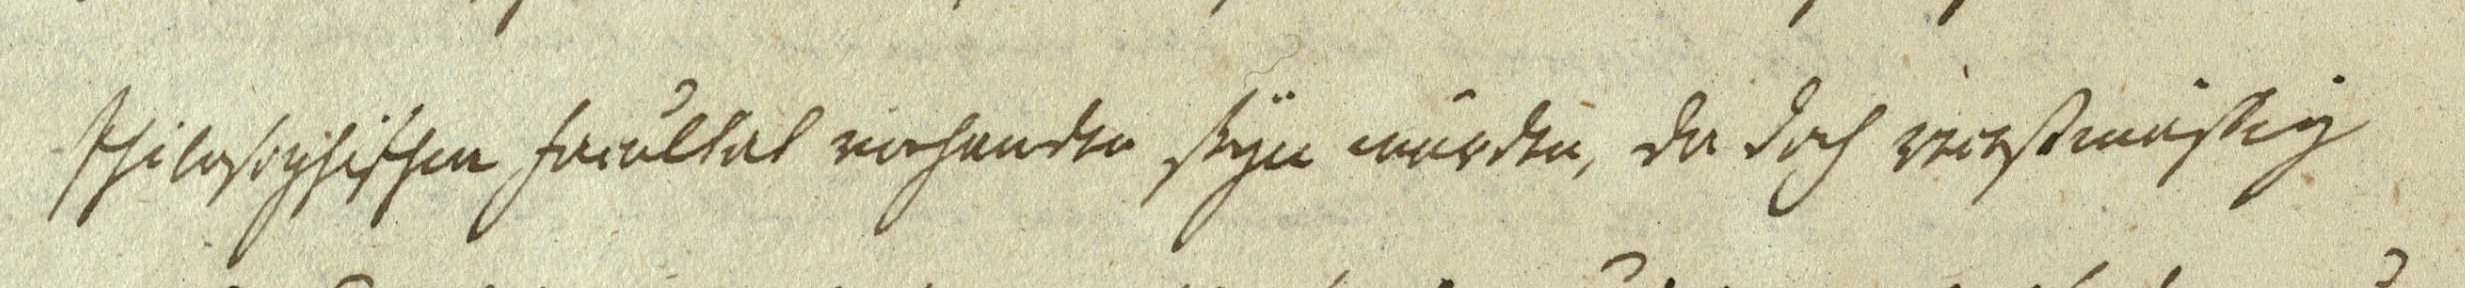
Philosophischen Facultät vorhanden seÿn würden, da doch rechtmässig
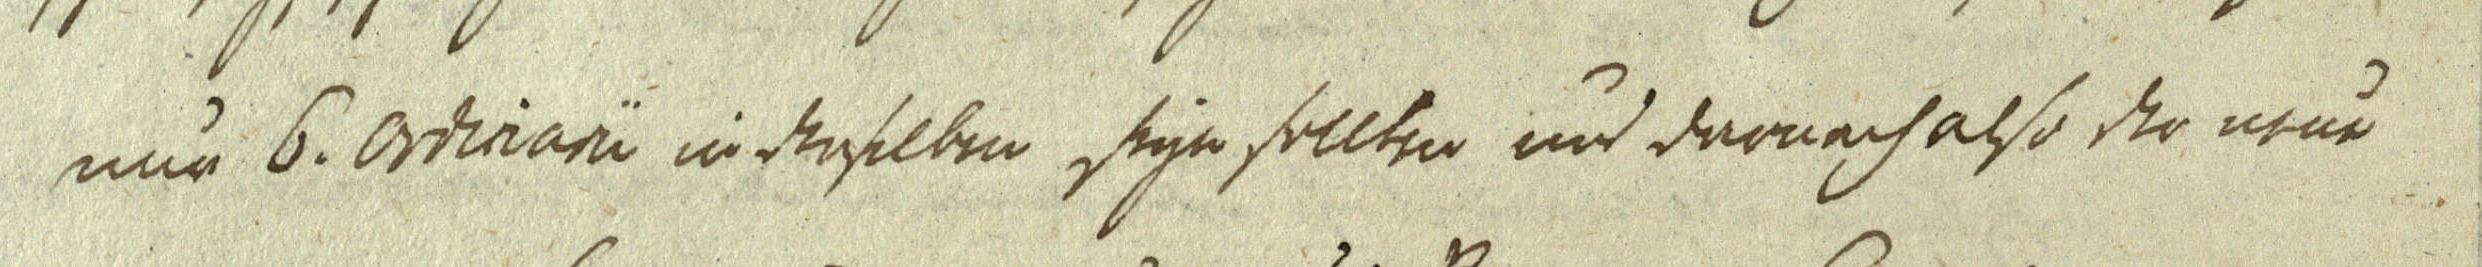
nur 6. Ordinarii in derselben seÿn sollten und darnach also der neue
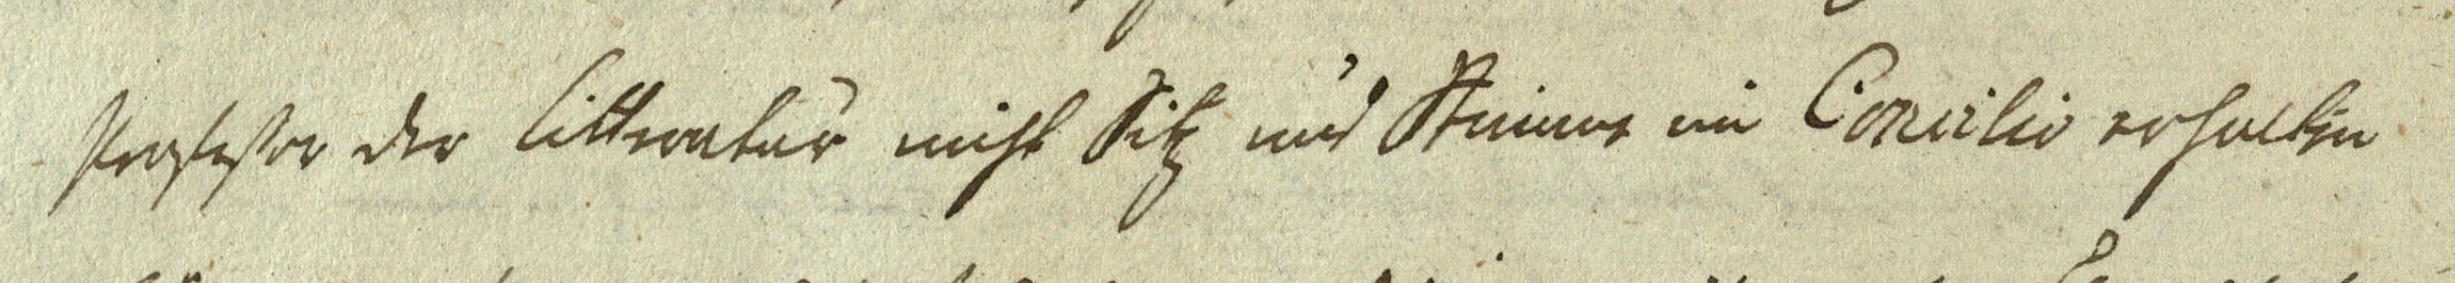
Proffesor der Litteratur nicht Sitz und Stimme im Concilio erhalten
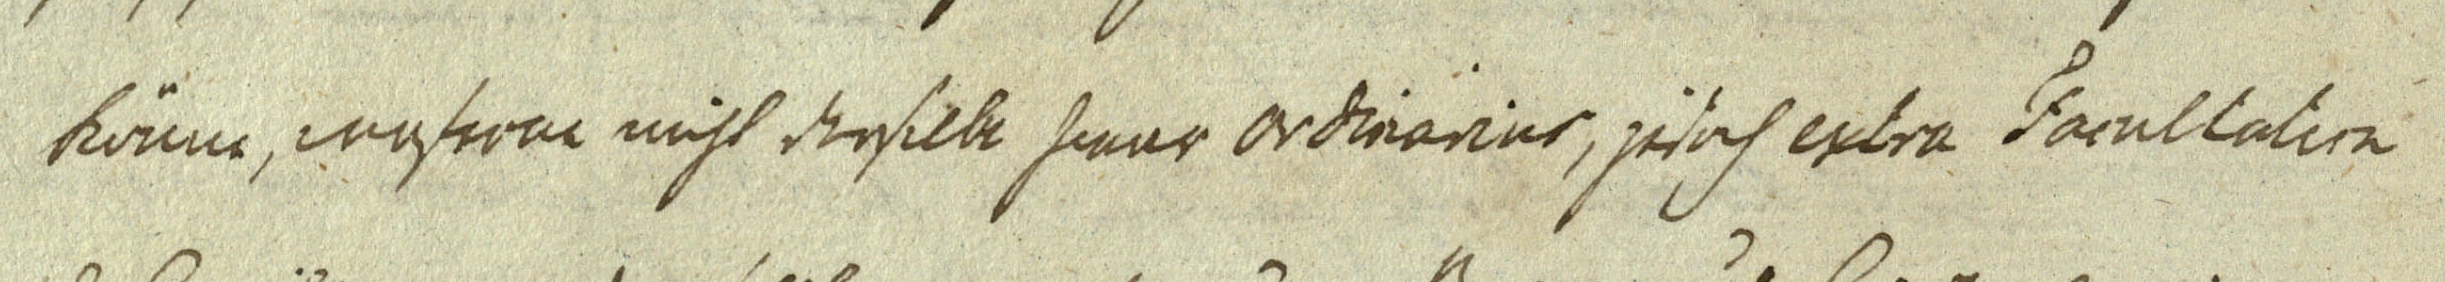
könne, woferne nicht derselbe zwar Ordinarius, jedoch extra Facultatem
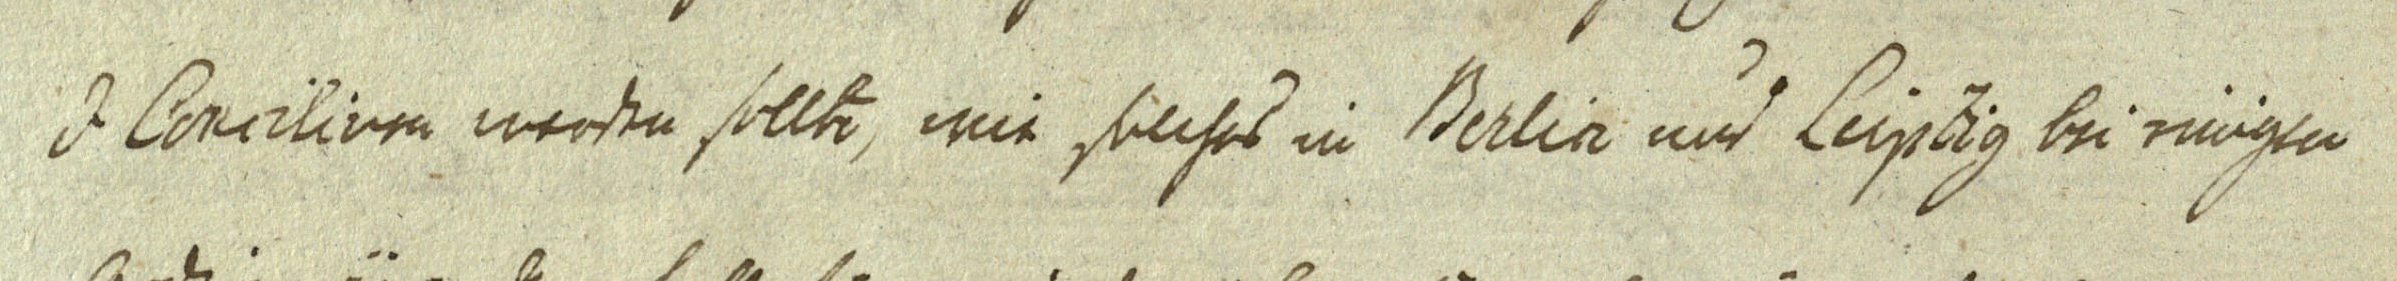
et Concilium werden sollte, wie solches in Berlin und Leipzig bei einigen
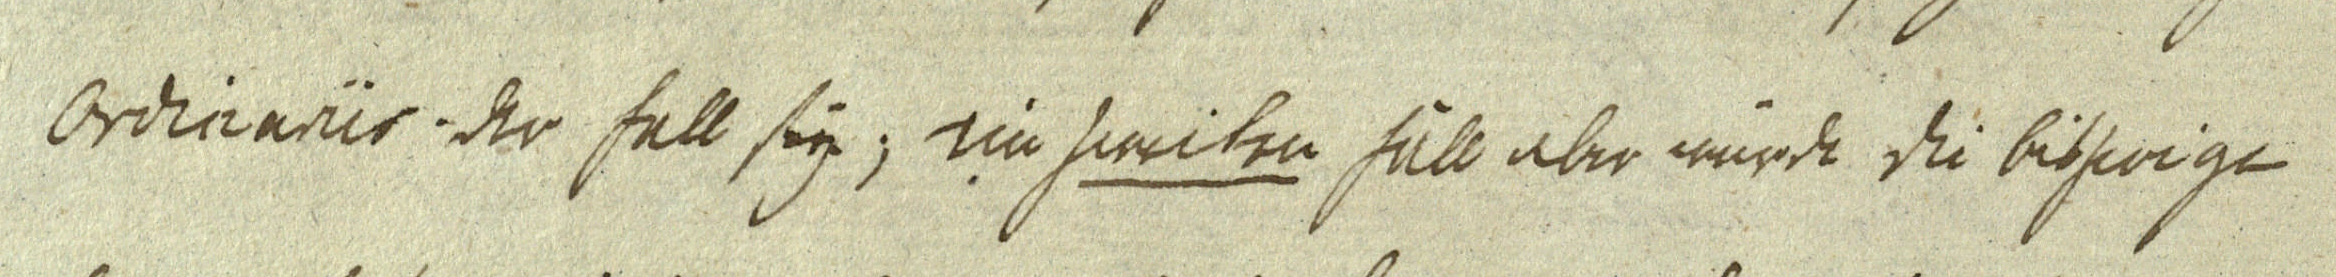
Ordinariis der Fall seÿ; im zweiten Fall aber würde die bisherige
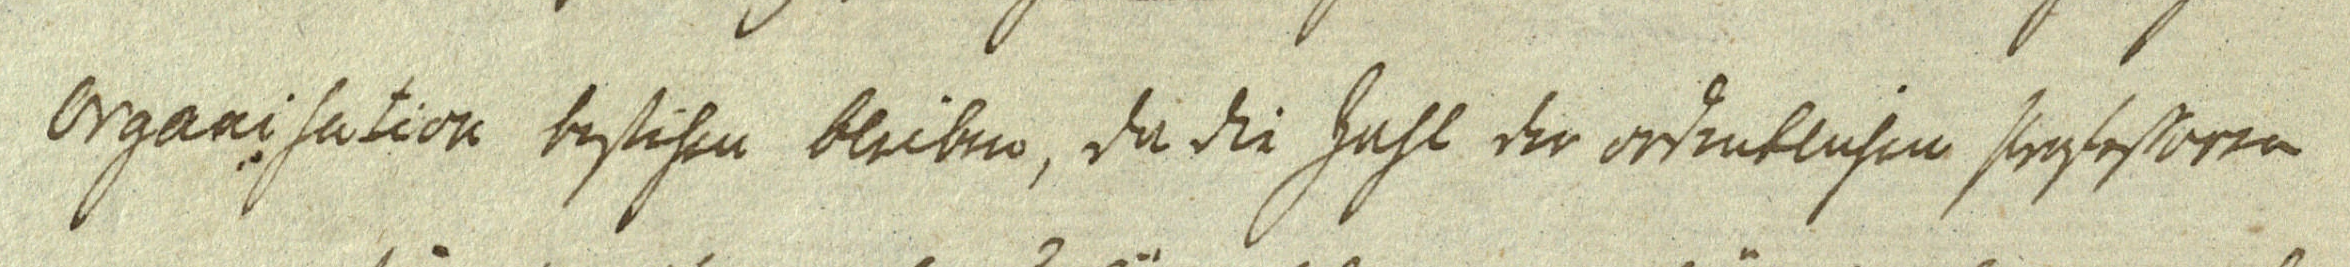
Organisation bestehen bleiben, da die Zahl der ordentlichen Professoren
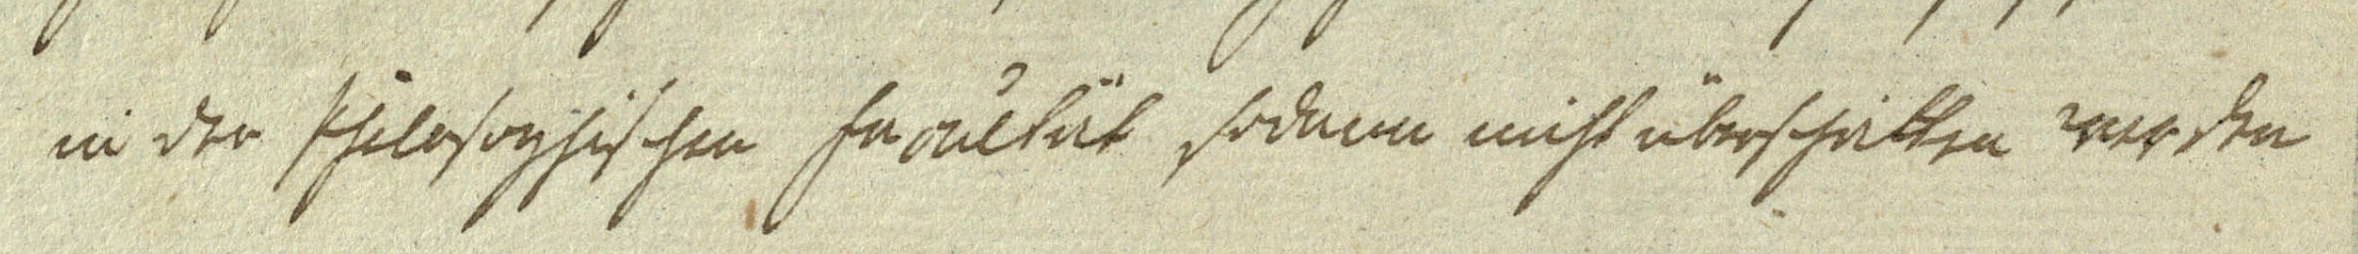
in der Philosophischen Facultät sodann nicht überschritten werden
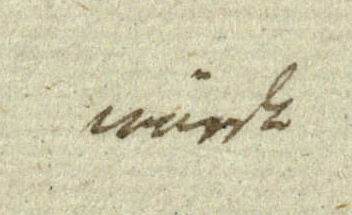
würde
